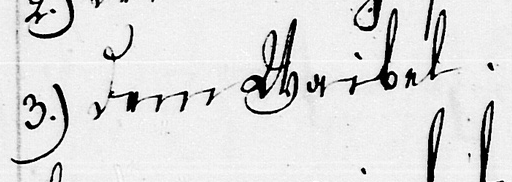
3.) Dem Waibel
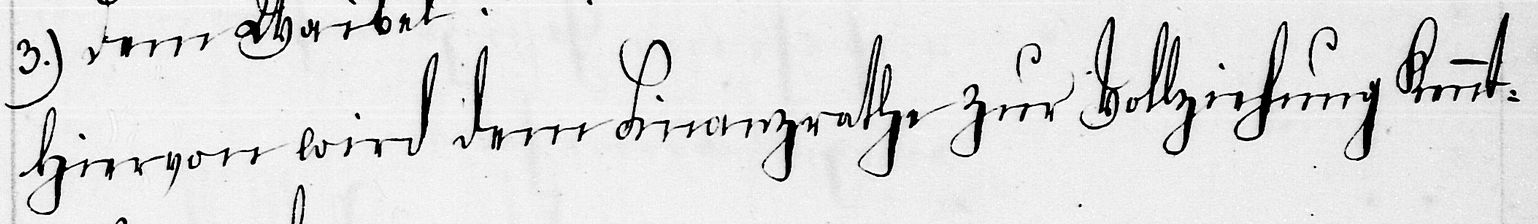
Hiervon wird dem Finanzrathe zur Vollziehung Ken¬
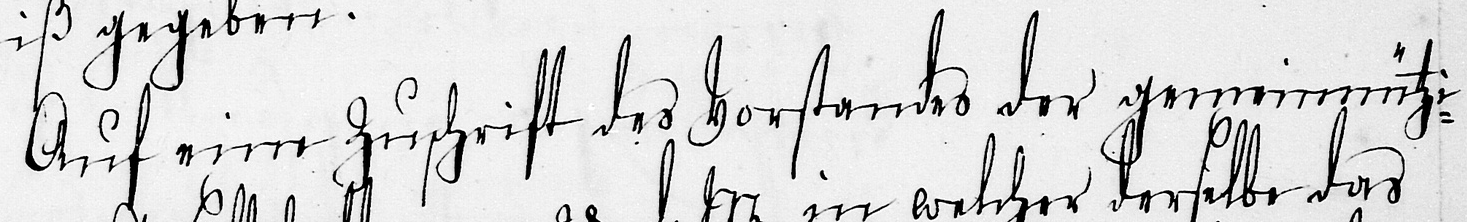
Auf eine Zuschrift des Vorstandes der gemeinnützi¬
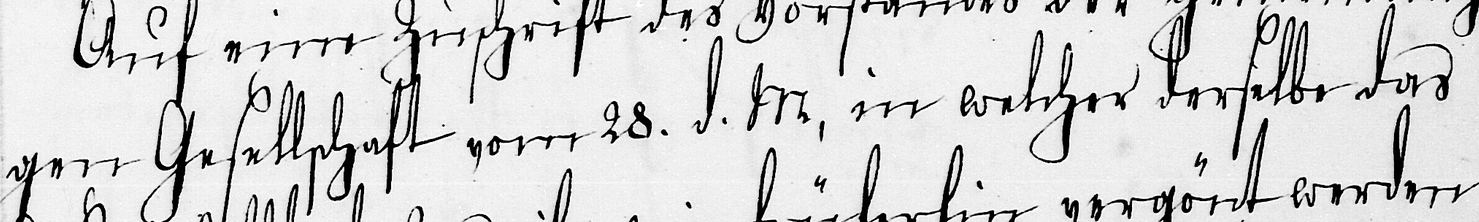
gen Gesellschaft vom 28. d. M., in welcher derselbe das
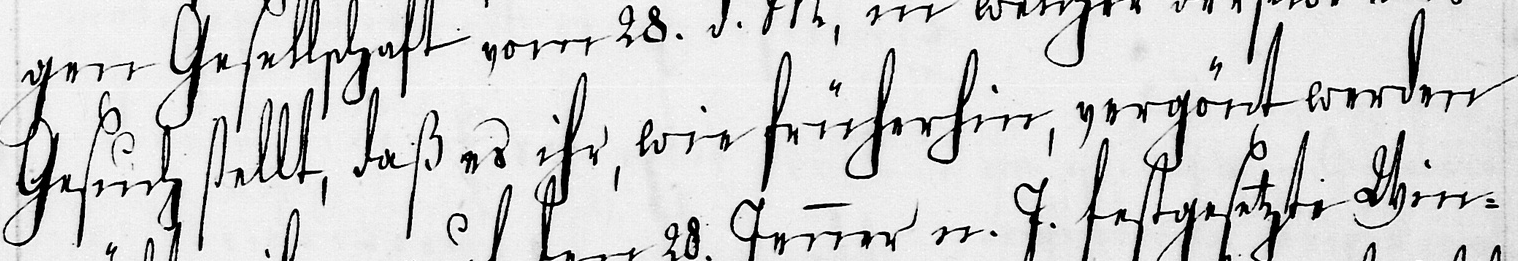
Gesuch stellt, daß es ihr, wie früherhin, vergönt werden
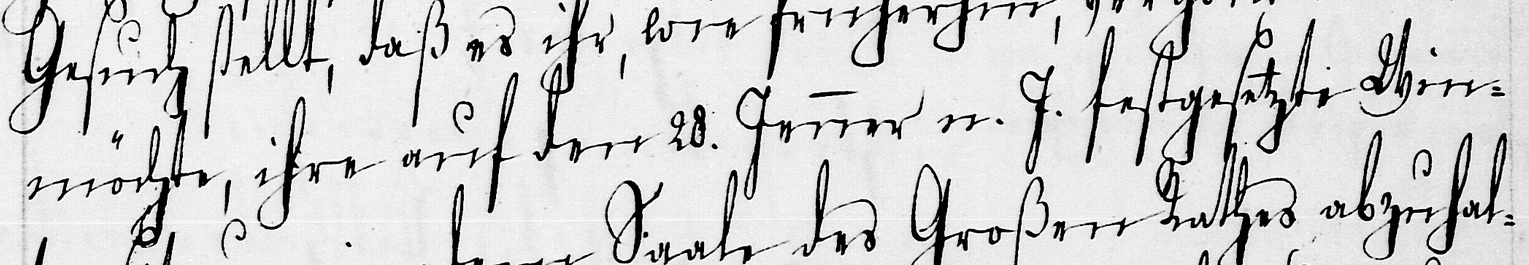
möchte, ihre auf den 28. Jenner n. J. festgesetzte Win¬
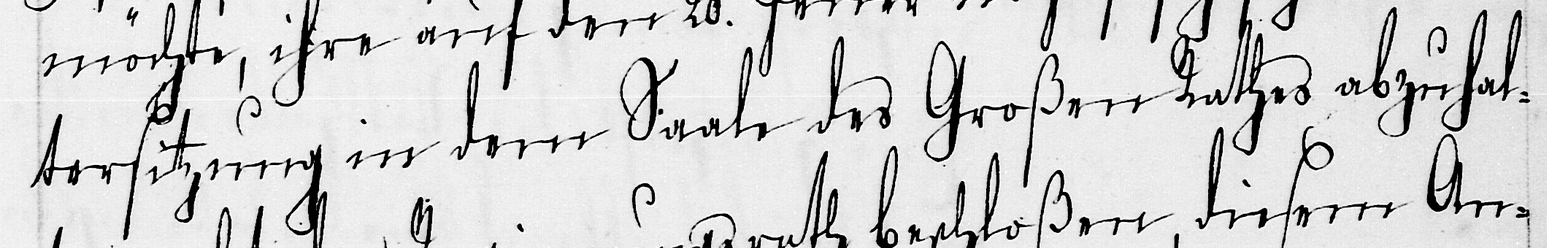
tersitzung in dem Saale des Großen Rathes abzuhal¬
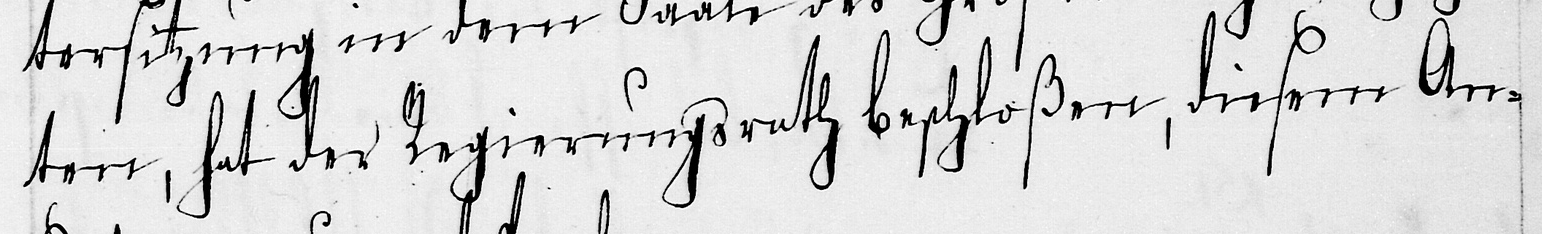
ten, hat der Regierungsrath beschloßen, diesem An¬
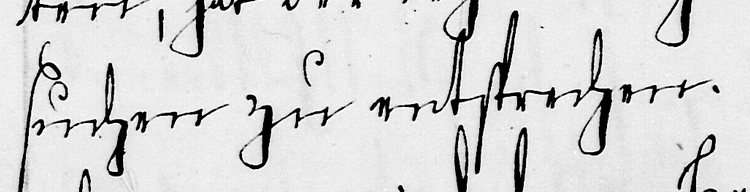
suchen zu entsprechen.
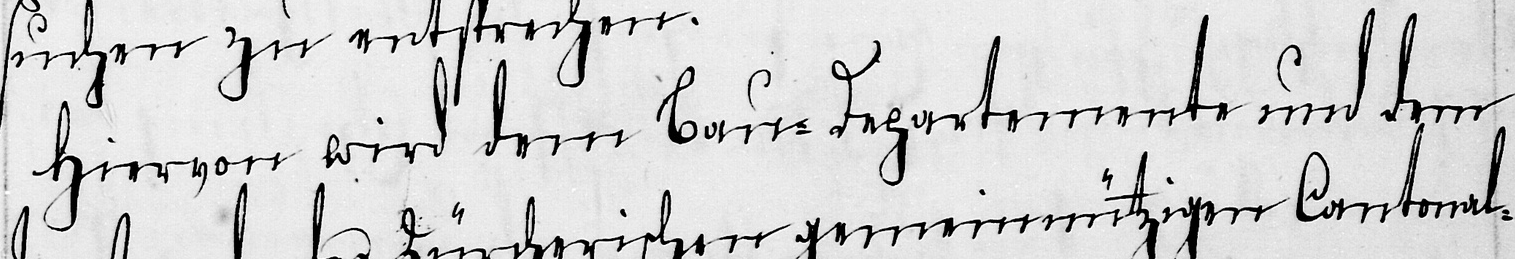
Hiervon wird dem Bau-Departemente und dem
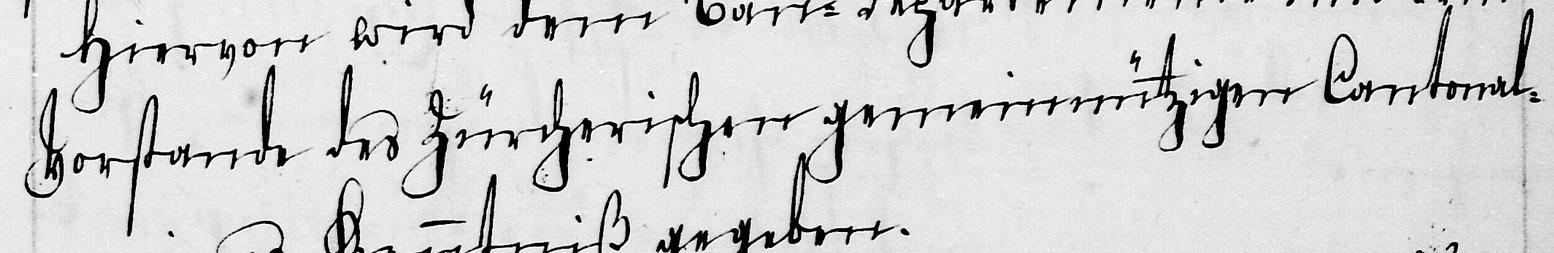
Vorstande des Zürcherischen gemeinnützigen Cantonal¬
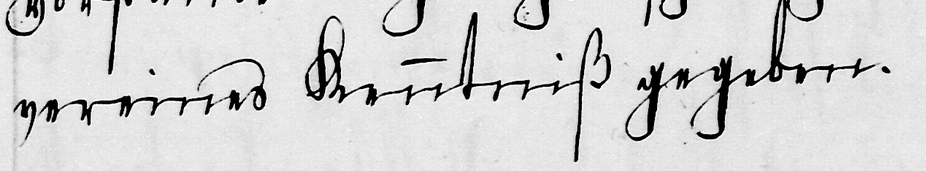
vereines Kenntniß gegeben.
